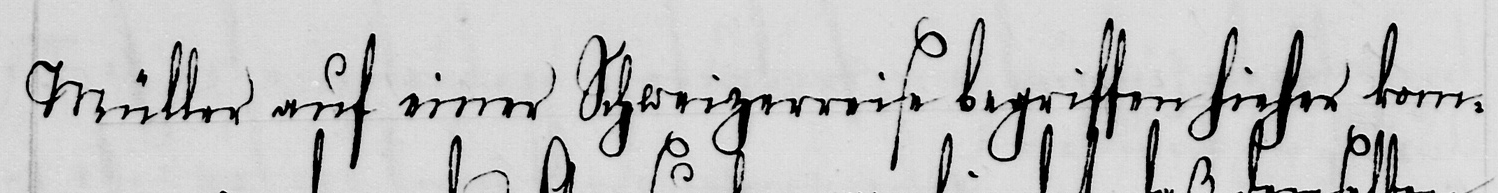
Müller auf einer Schweizerreise begriffen hieher kom¬
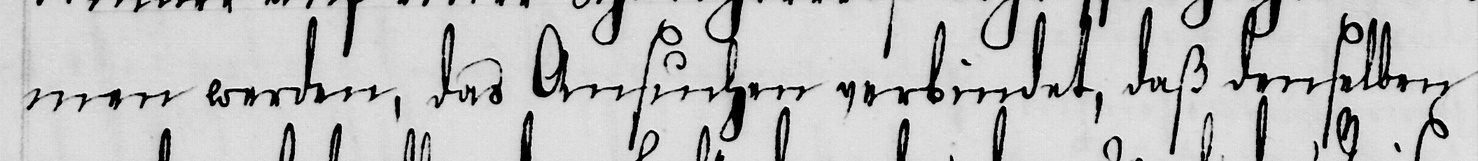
men werden, das Ansuchen verbindet, daß denselben
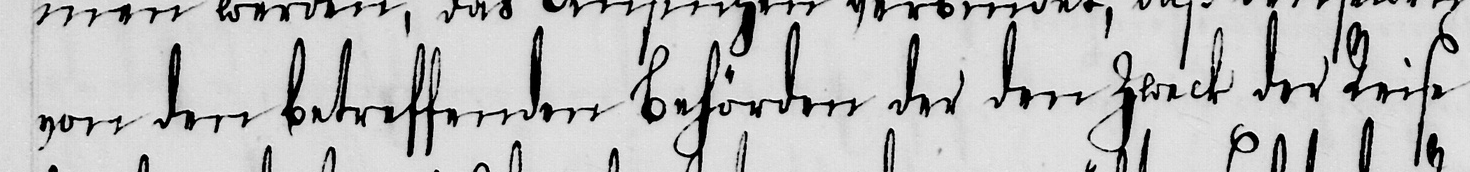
von den betreffenden Behörden der den Zweck der Reise
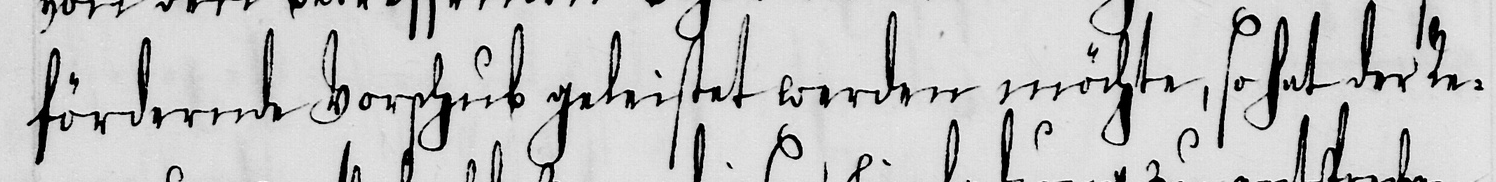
fördernde Vorschub geleistet werden möchte, so hat der R¬
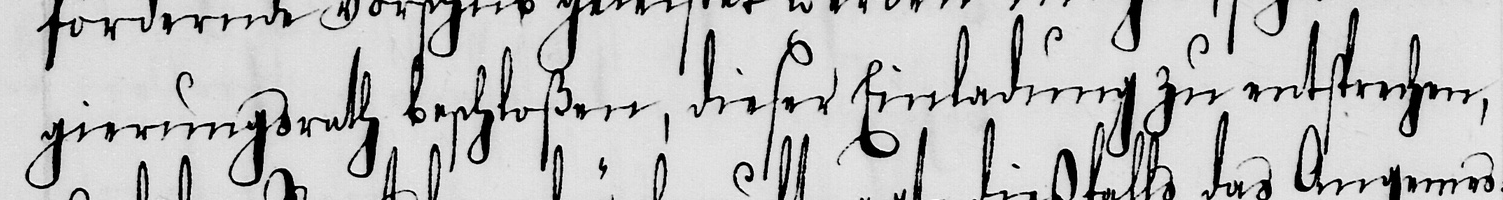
egierungsrath beschloßen, dieser Einladung zu entsprechen,
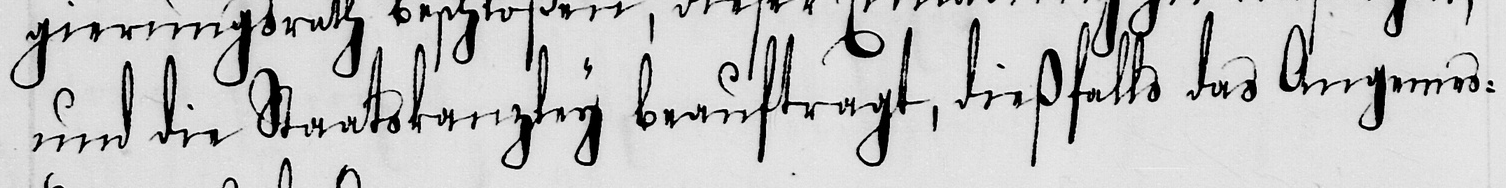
und die Staatskanzley beauftragt, dießfalls das Angeme¬
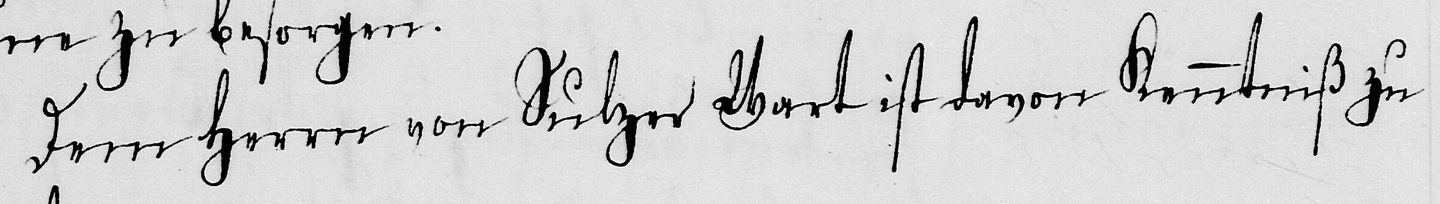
Dem Herrn von Sulzer Wart ist davon Kenntniß zu
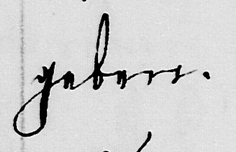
geben.
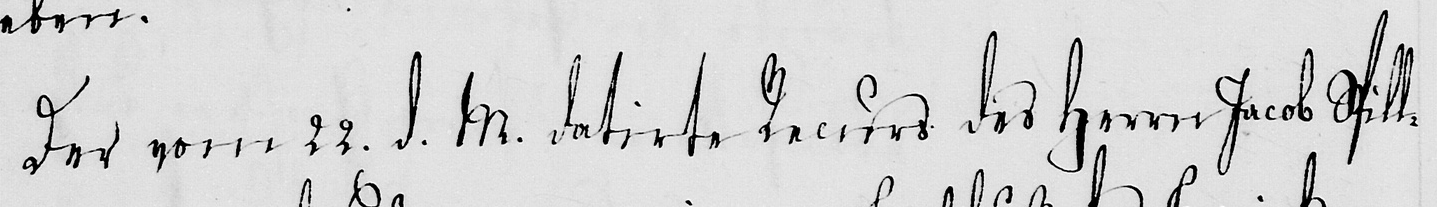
Der vom 22. d. M. datirte Recurs des Herrn Jacob Spi¬
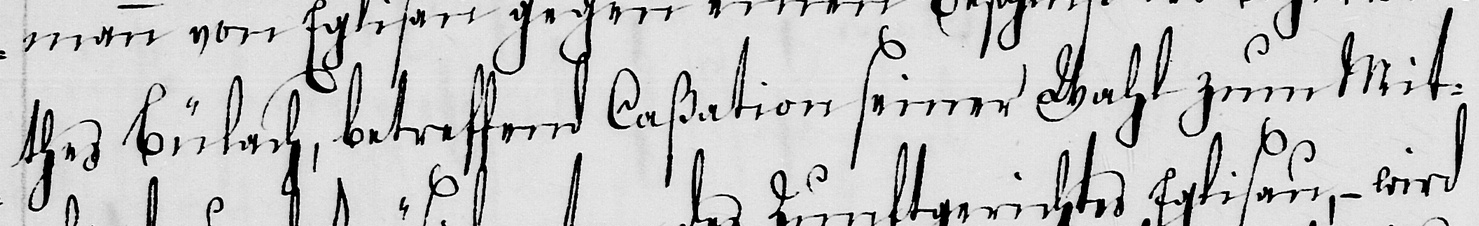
thes Bülach, betreffend Caßation seiner Wahl zum Mit¬
